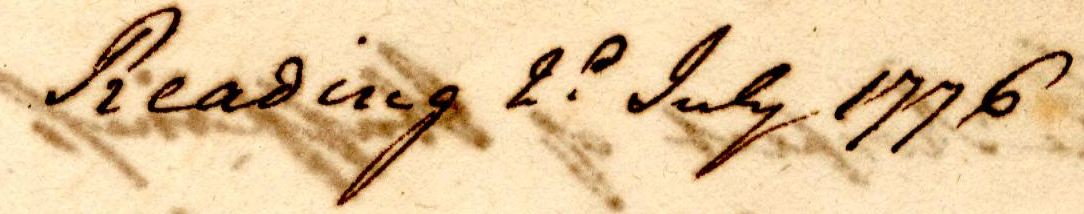Reading 2^d. July 1776
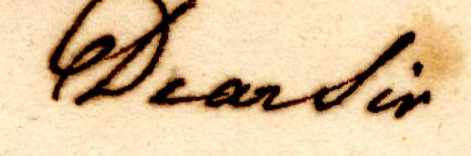Dear Sir
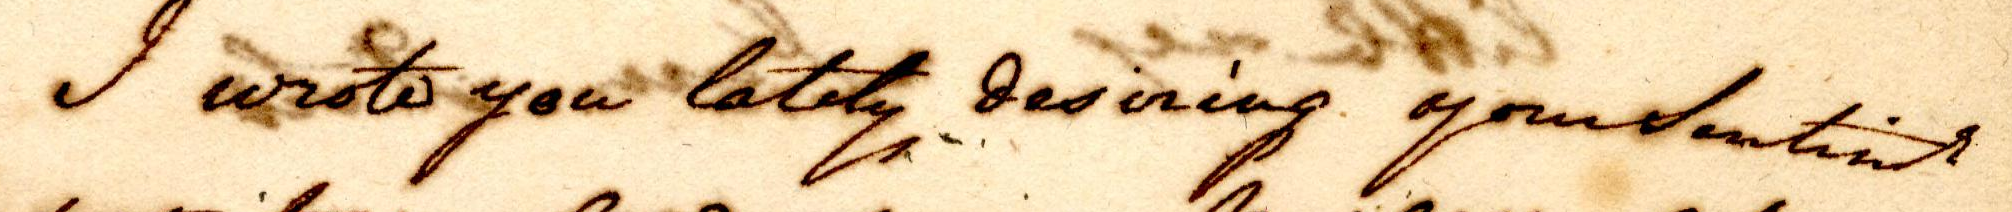I wrote you lately desiring your Sentiment
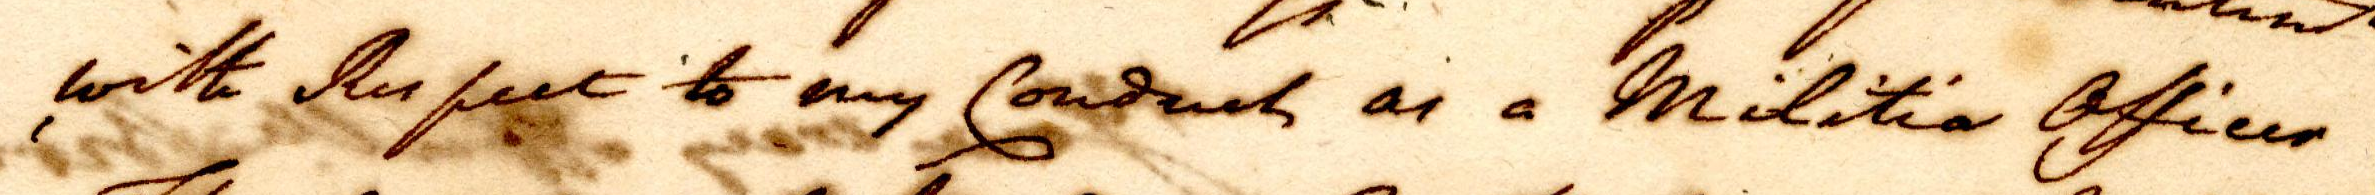with Respect to my Conduct as a Militia Officer
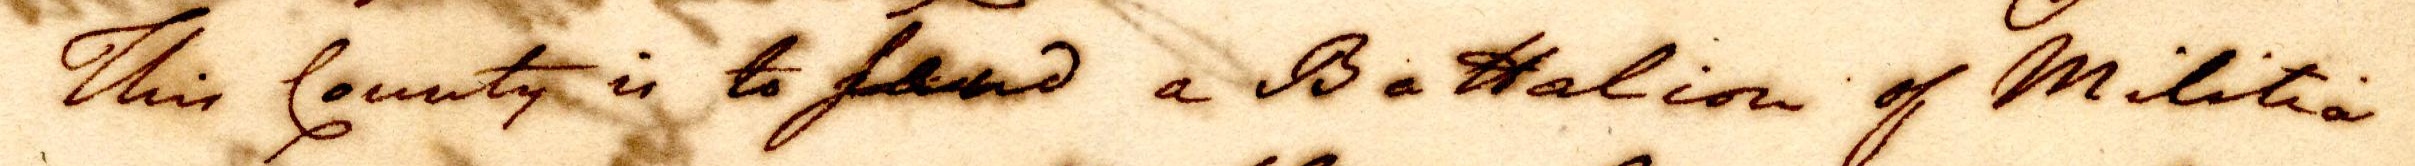This County is to send a Battalion of Militia
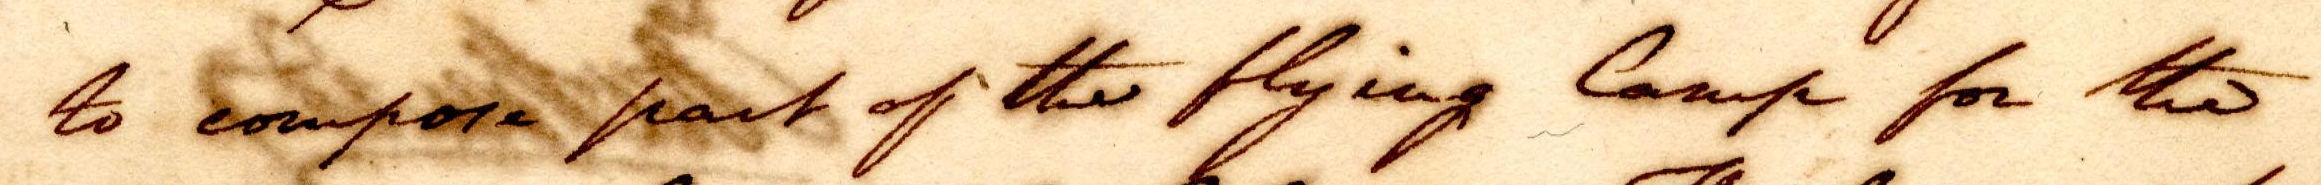to compose part of the flying Camp for the
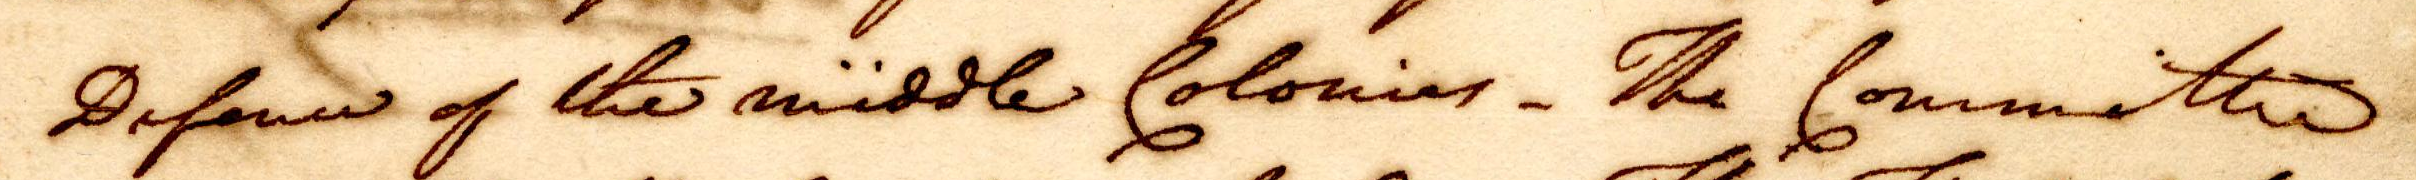Defence of the middle Colonies. The Committee
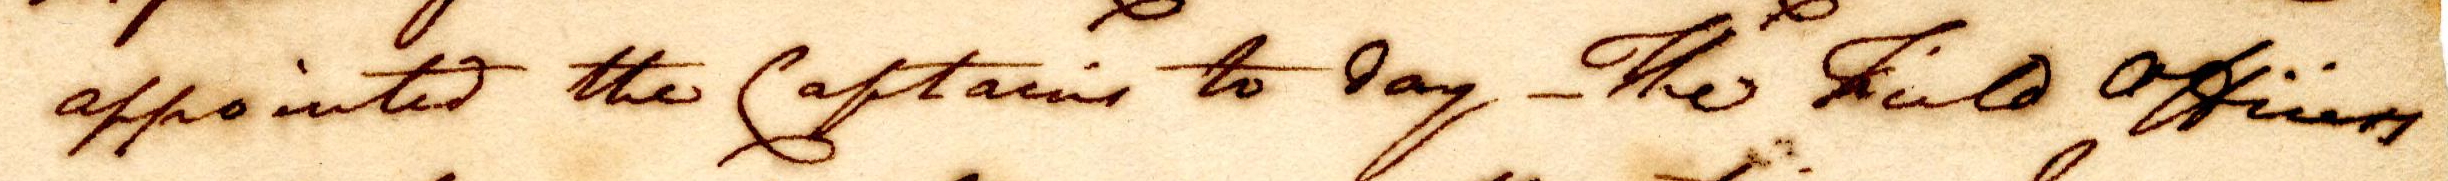appointed the Captains to day. The Field officers
